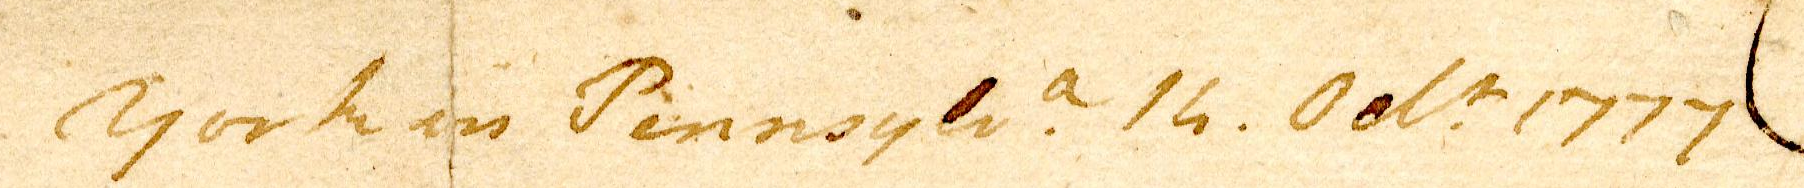York in Pennsylv^a. 14. Oct^r. 1777
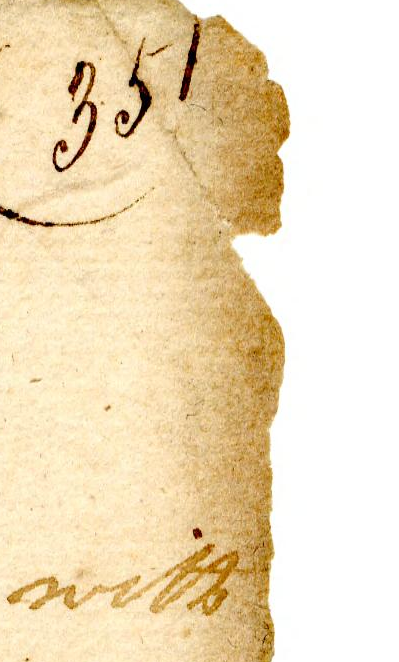351
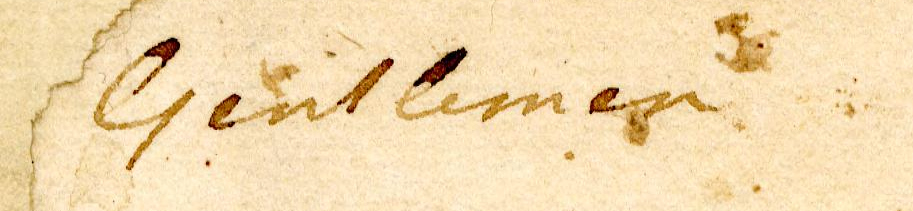Gentlemen
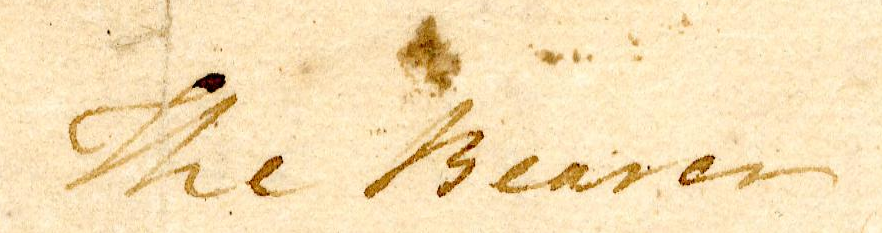The Bearer
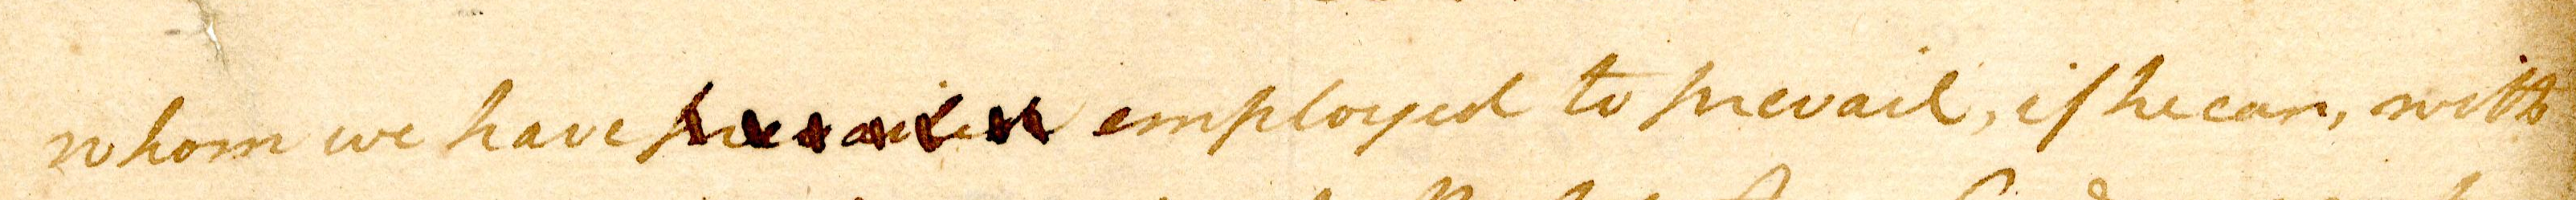whom we have [______] employed to prevail, if he can, with
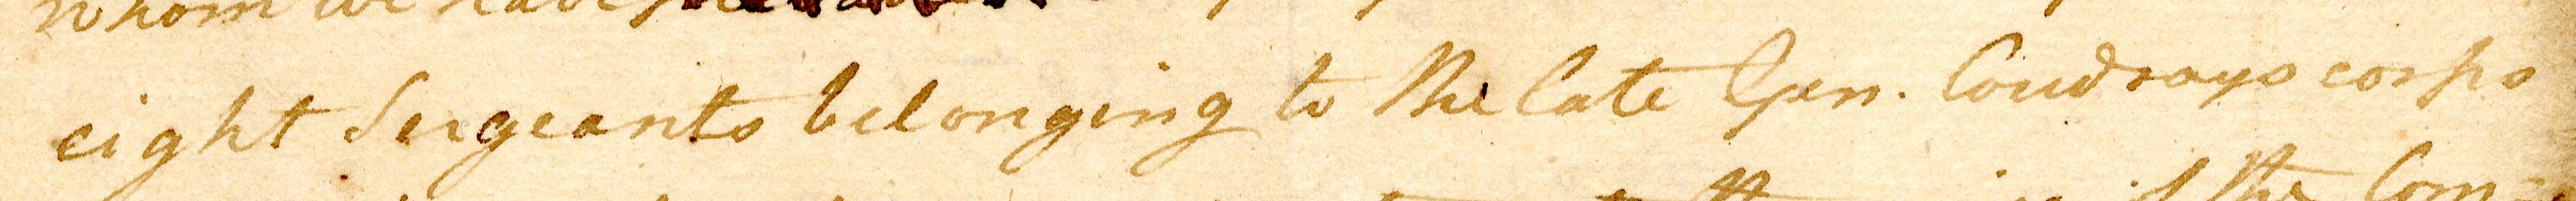eight Sergeants belonging to the late Gen^l. Coudrays corps
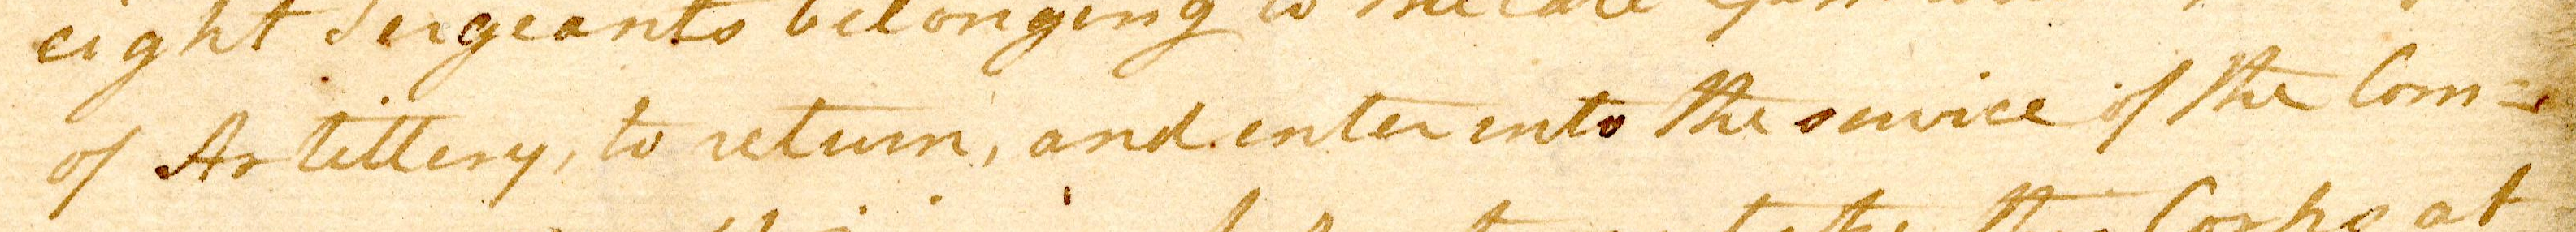of Artillery, to return, and enter into the service of the Com-
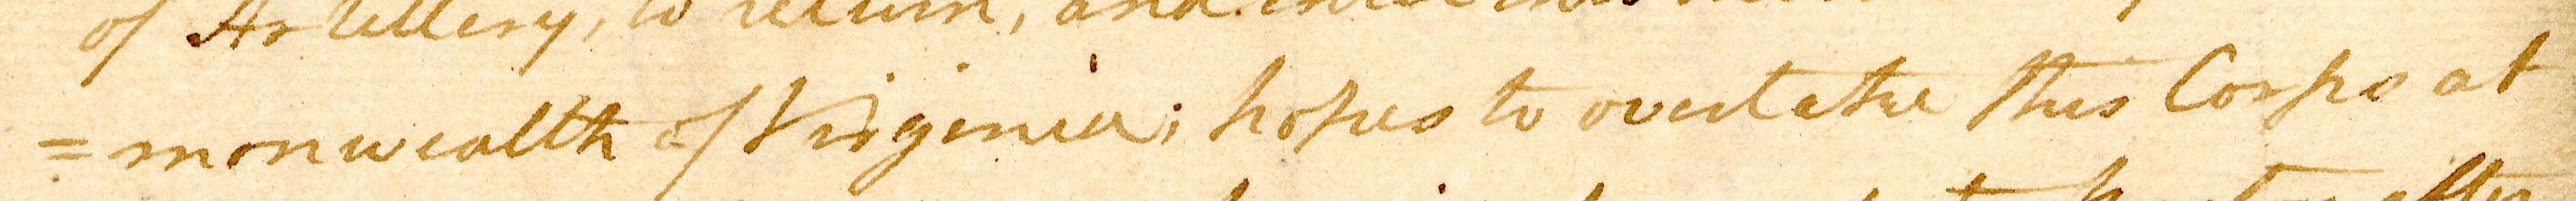-monwealth of Virgina; hopes to over take this Corps at
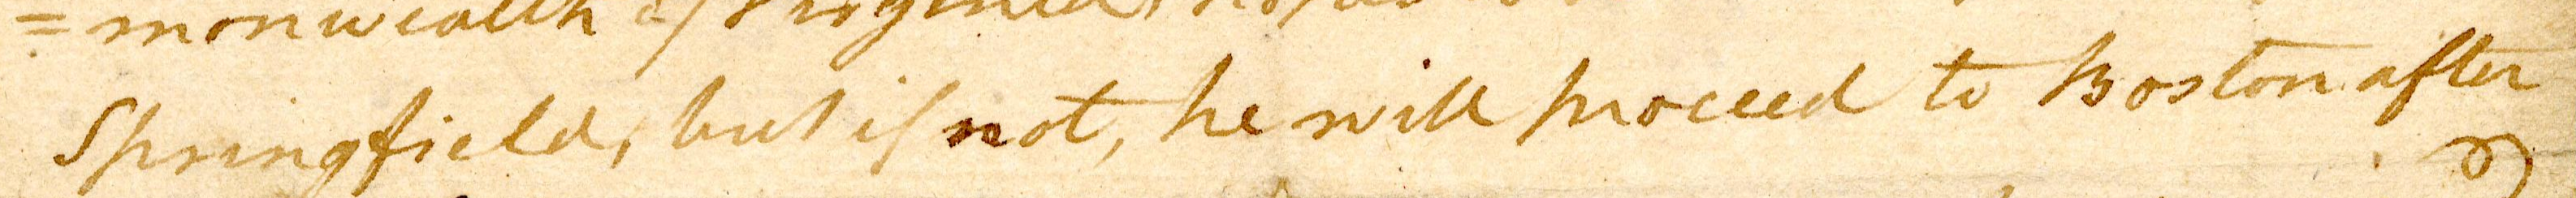Springfield, but if not, he will proceed to Boston after
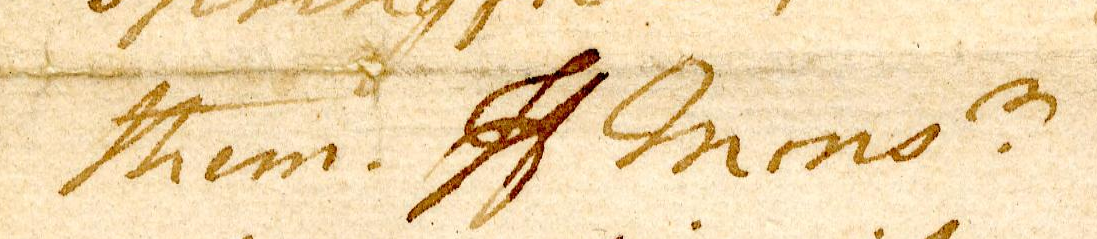them. If Mons^r.
